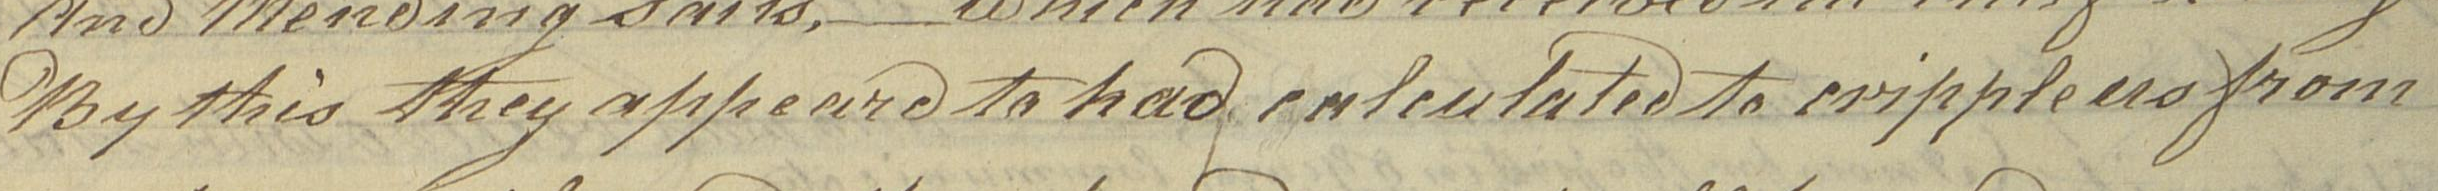By this they appeard to had calculated to cripple us from
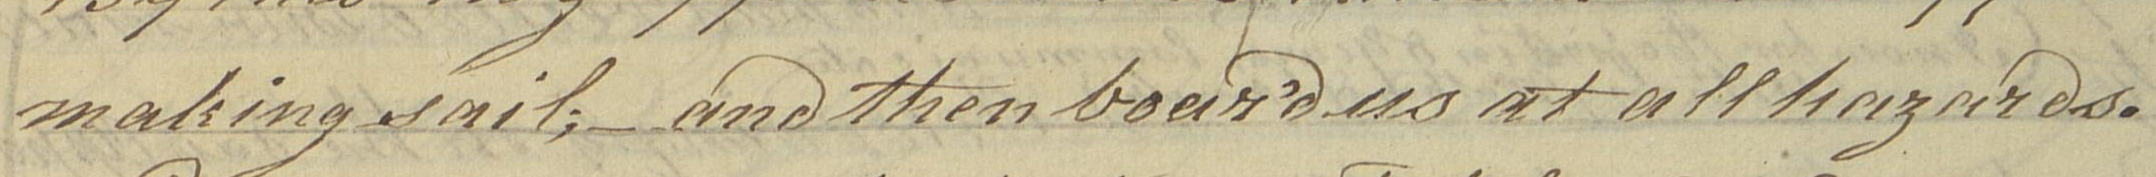making sail; and then board us at all hazards.
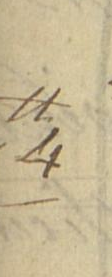4^th
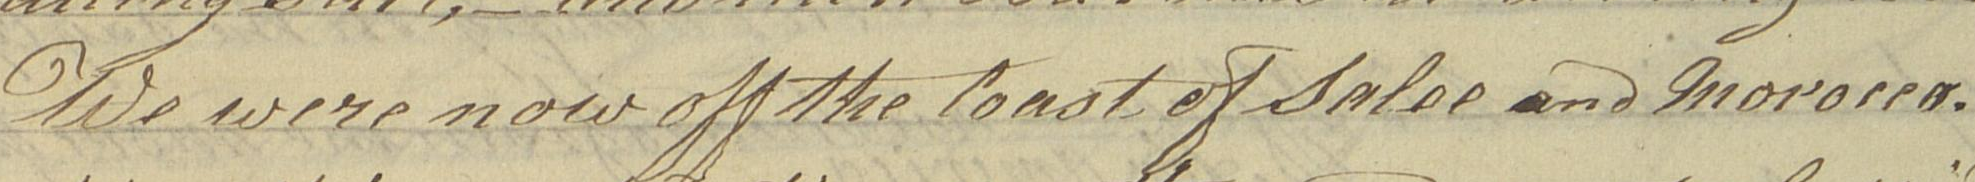We were now off the Coast of Salee and Morocco.
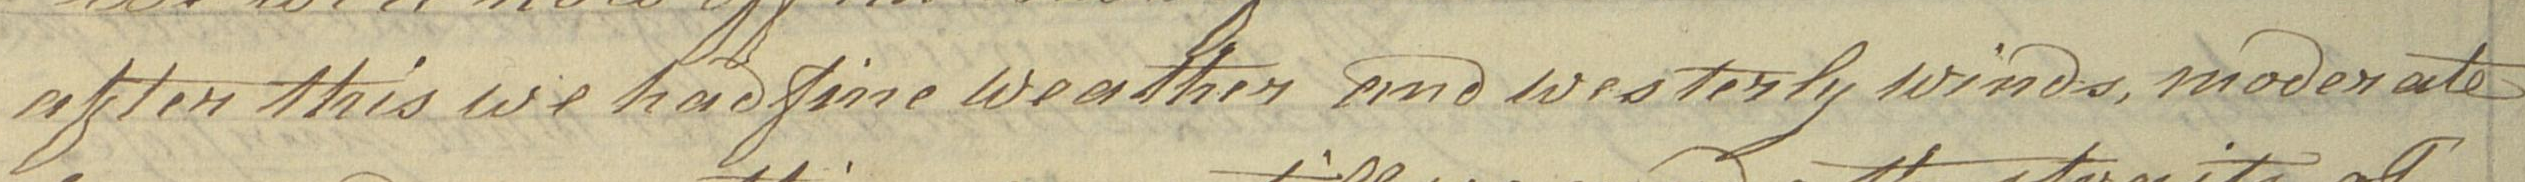after this we had fine weather and westerly winds, moderate
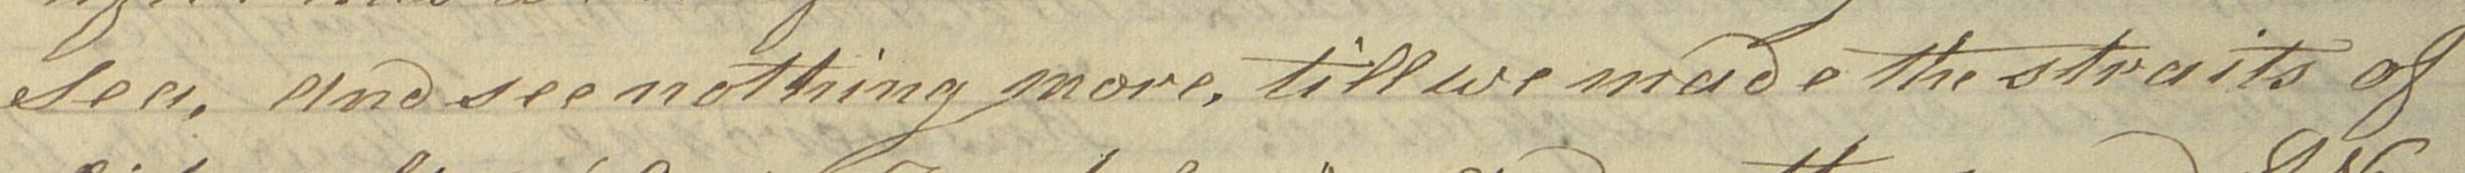Sea, and see nothing more, till we made the straits of
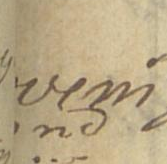-vem^r
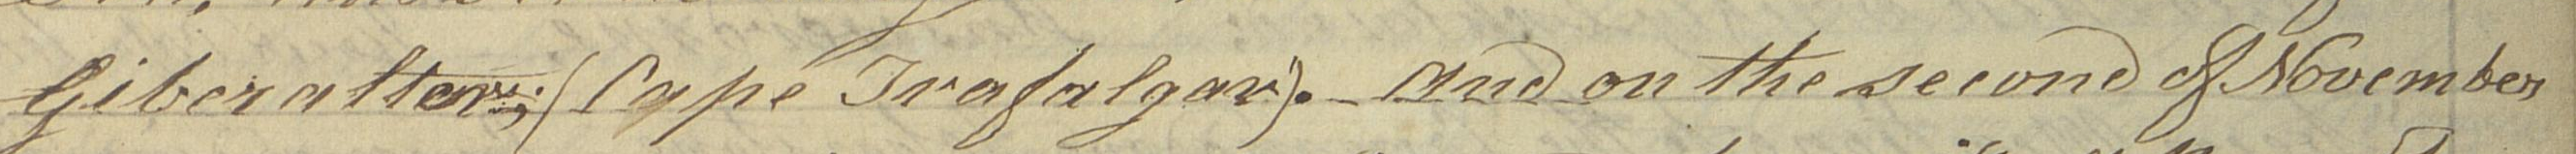Giberalter; (Cape Trafalgar). And on the second of November
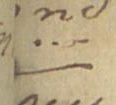2^nd
